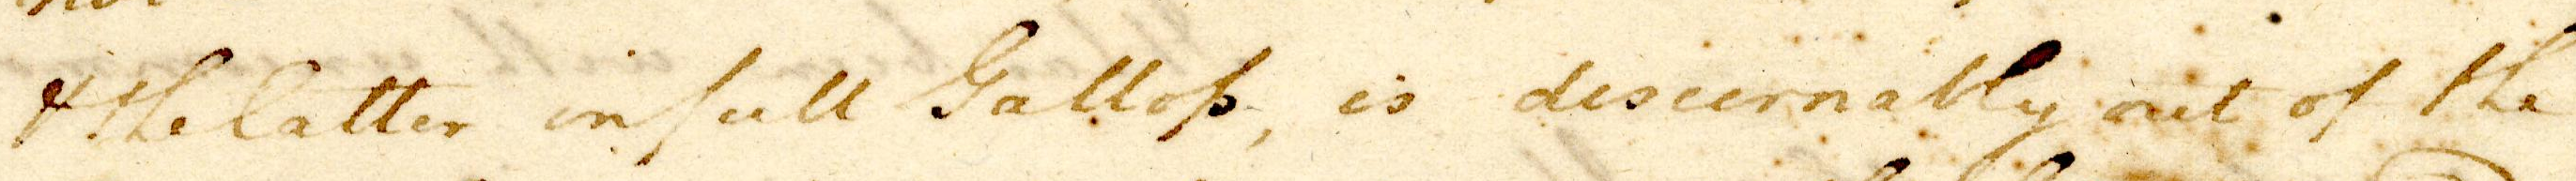& the latter in full Gallop is discernably out of the
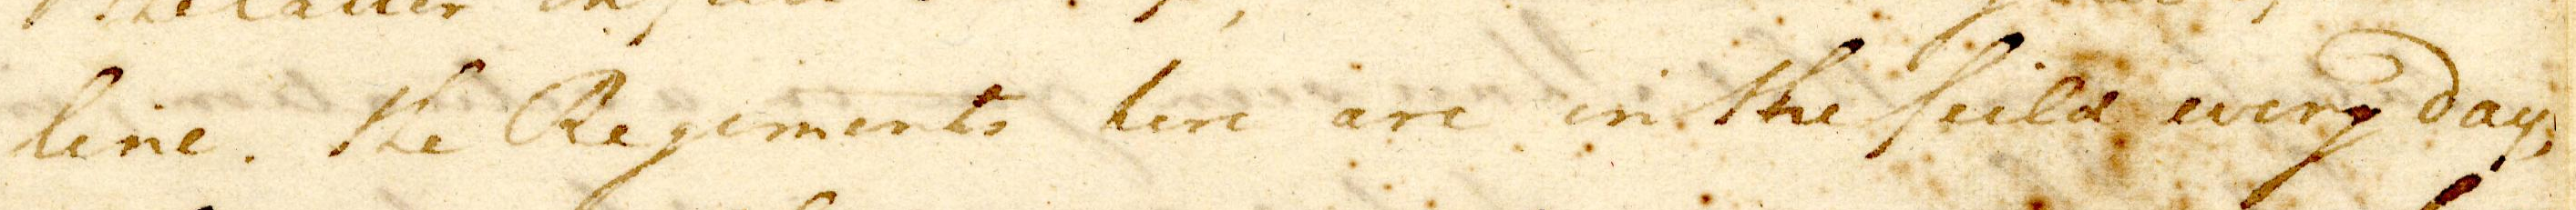line. The Regiments here are in the field every day
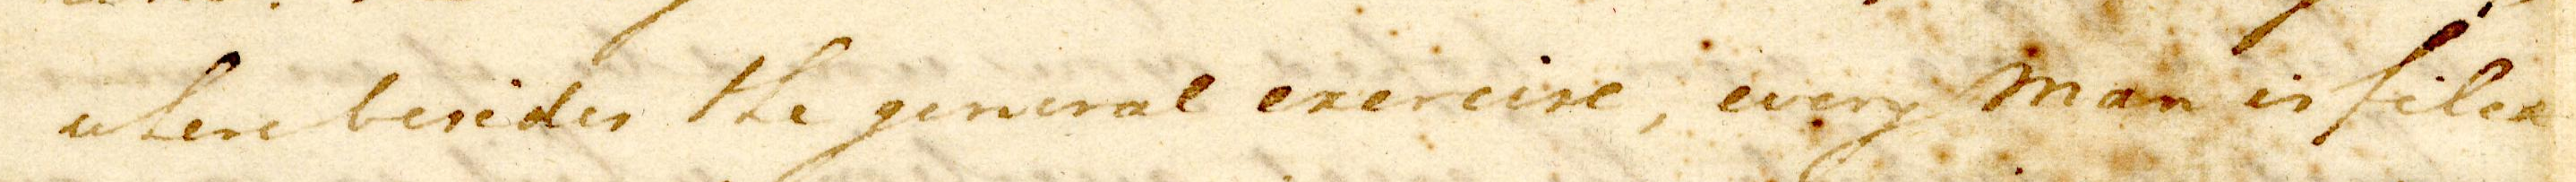where besides the general exercise, every man is filed
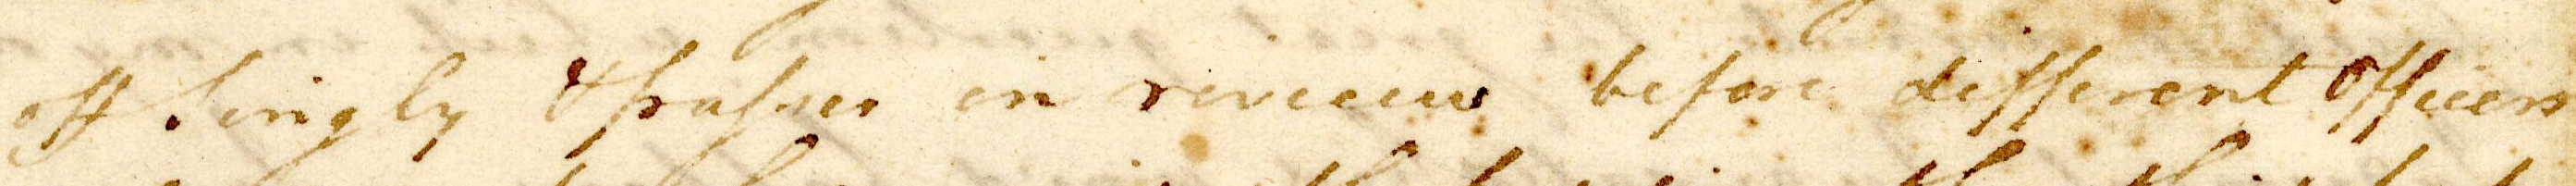off singly & passes in review before different Officers
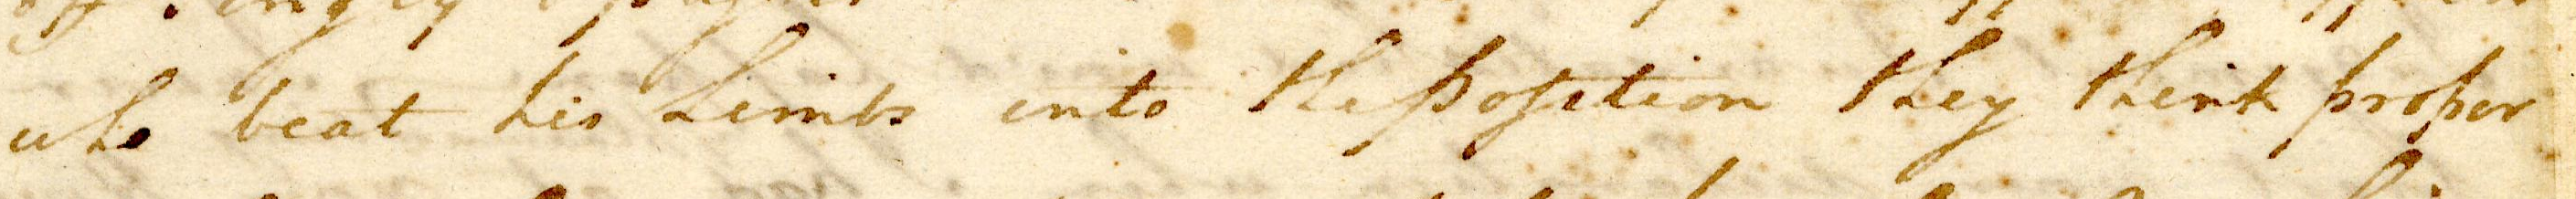who beat his Limb into the position they think proper
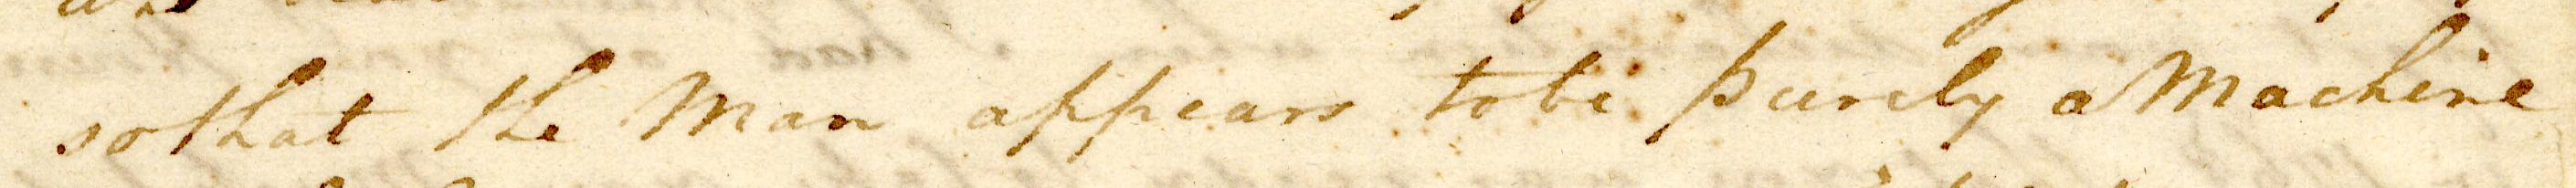so that the man appears to be purely a machine
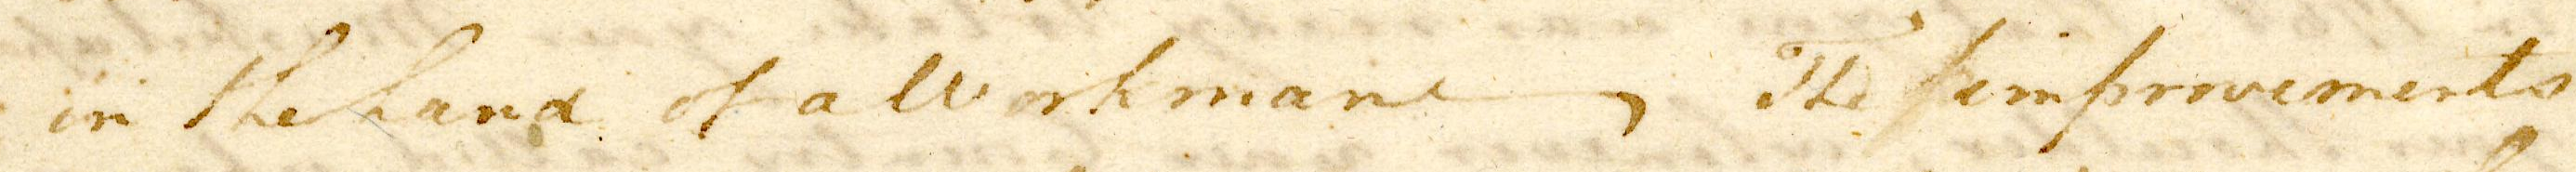in the hand of a Workman- The improvements
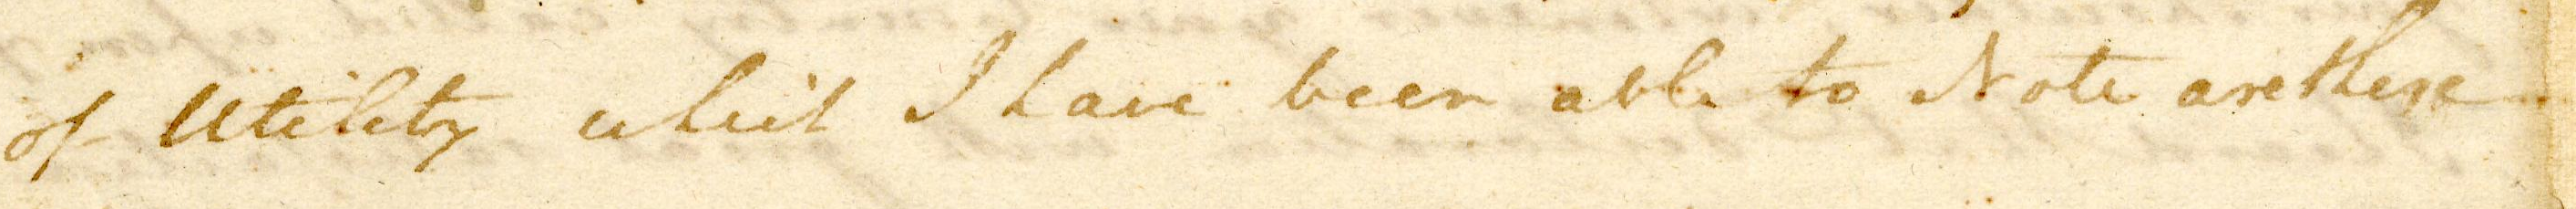of Utility which I have been able to Note are these
